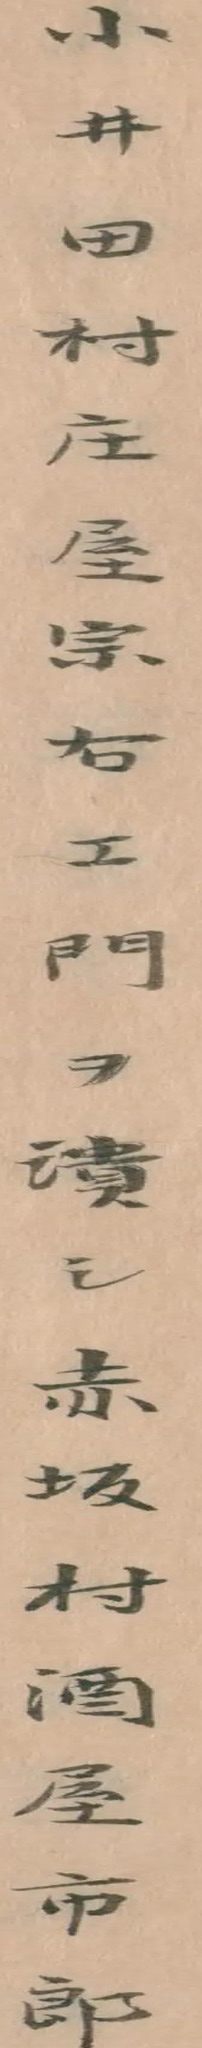小井田村庄屋宋右衛門ヲ潰シ赤坂村酒屋市郎
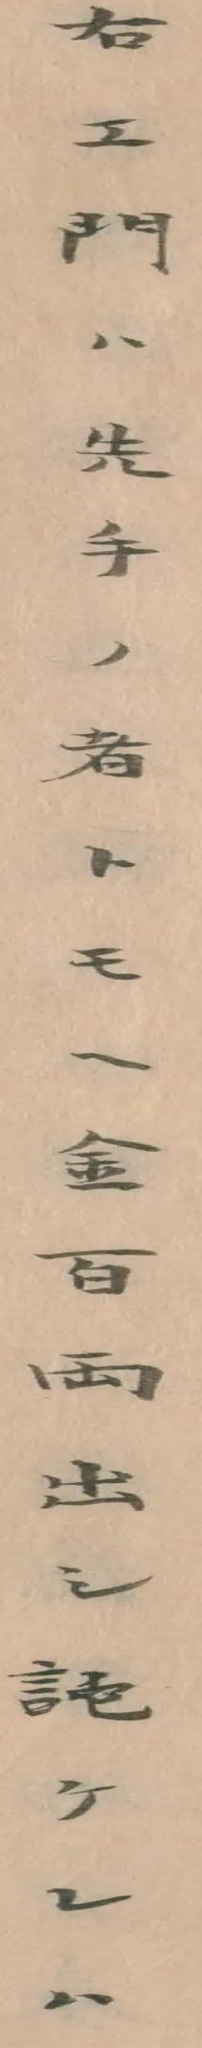右衛門ハ先手ノ者トモヘ金百両出シ詫ケレハ
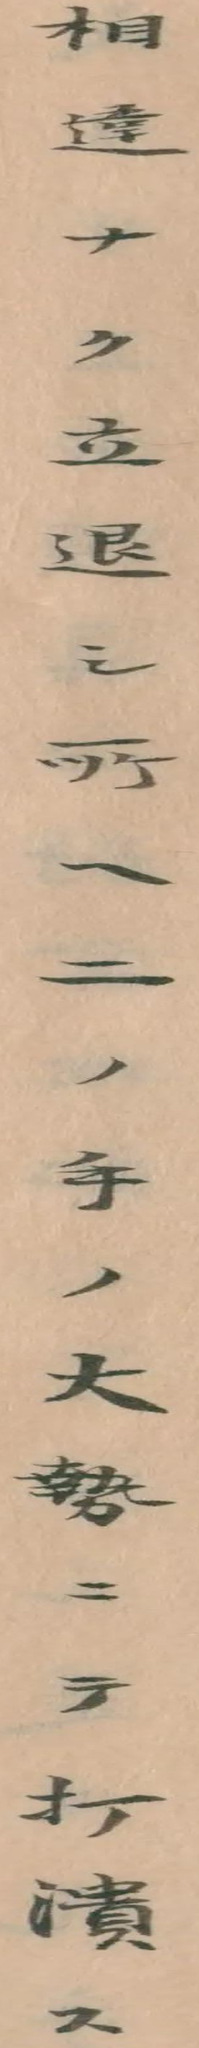相違ナク立退シ所ヘ二ノ手ノ大勢ニテ打潰ス

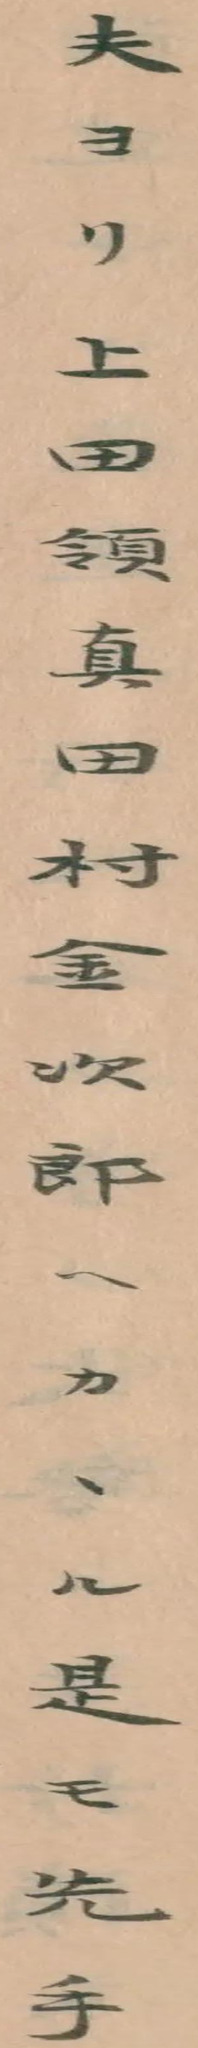夫ヨリ上田領真田村金次郎へカゝル是モ先手
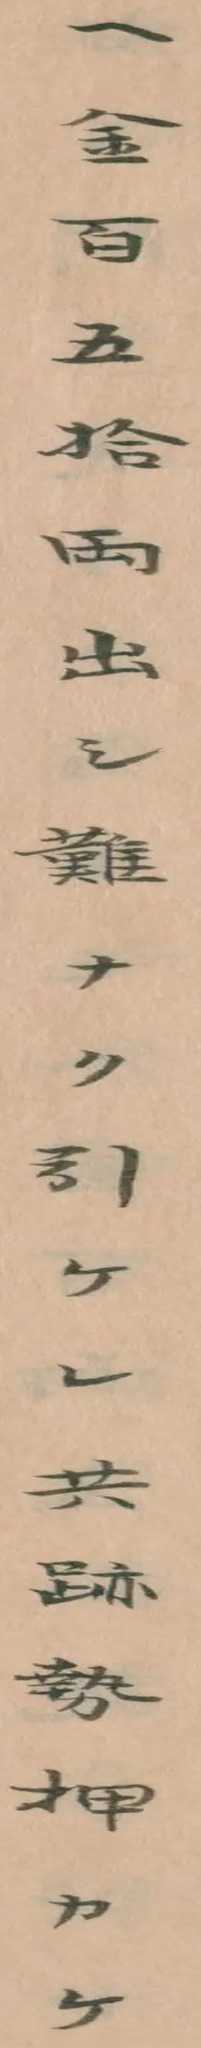へ金百五拾両出シ難ナク引ケレ共跡勢押カケ
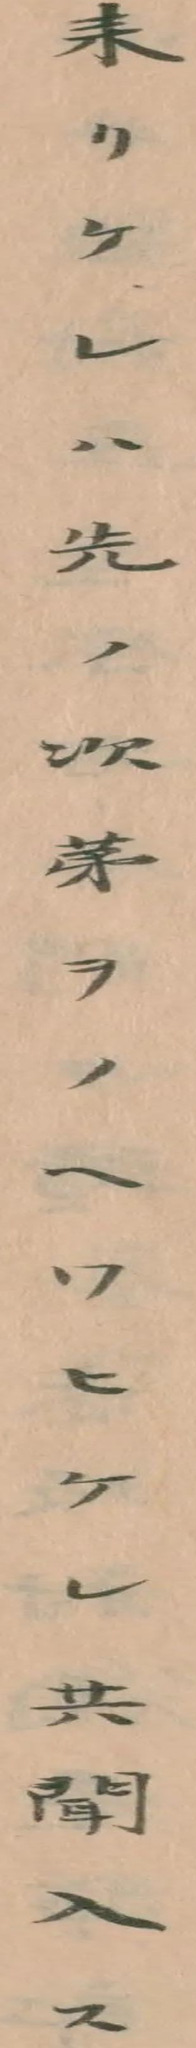来りケレハ先ノ次第ヲノへワヒケレ共聞入ス
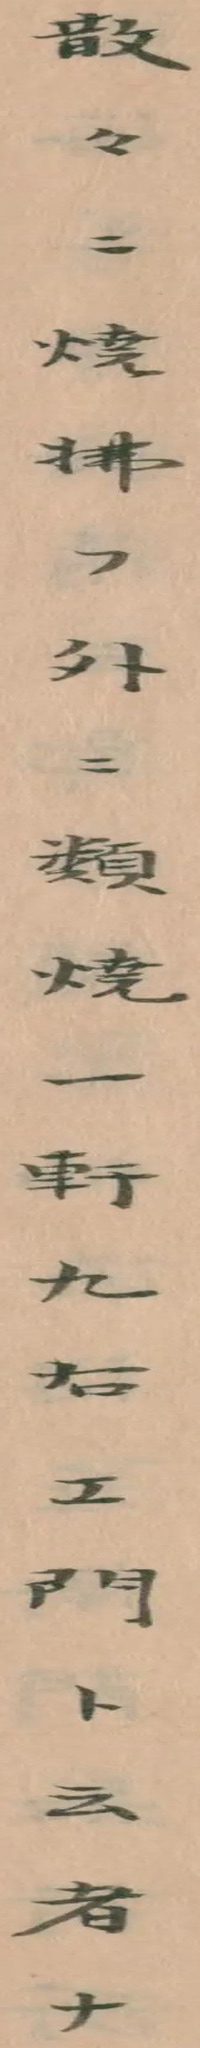散々二焼払フ外二類焼一軒九右衛門ト云者ナ
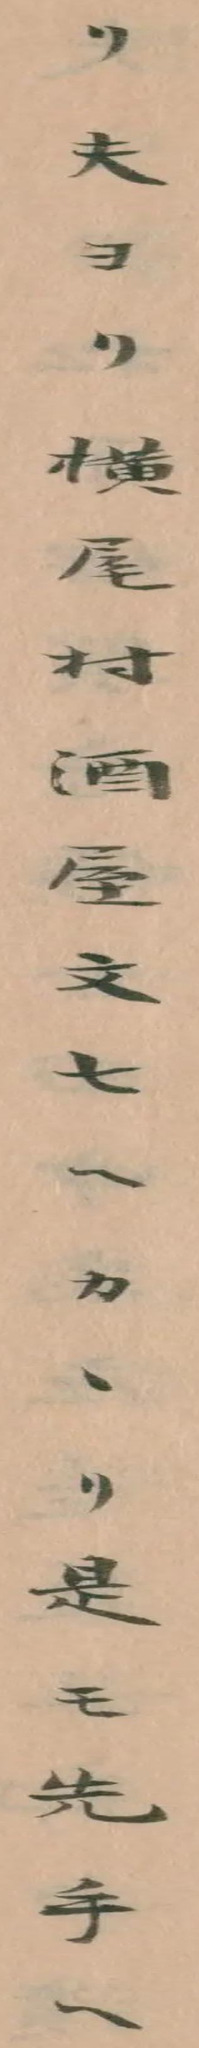リ夫ヨリ横尾村酒屋文七方へカゝ是モ先手へ
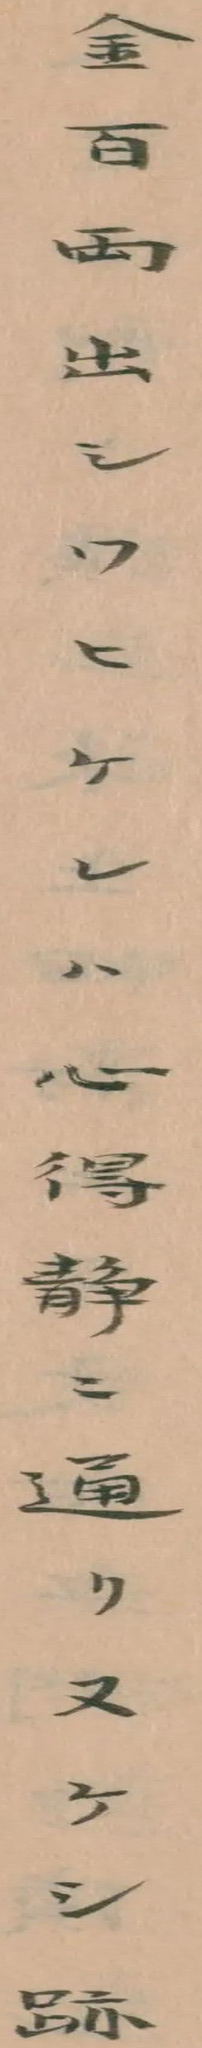金百両出シワヒケレハ心得静二通リヌケシ跡
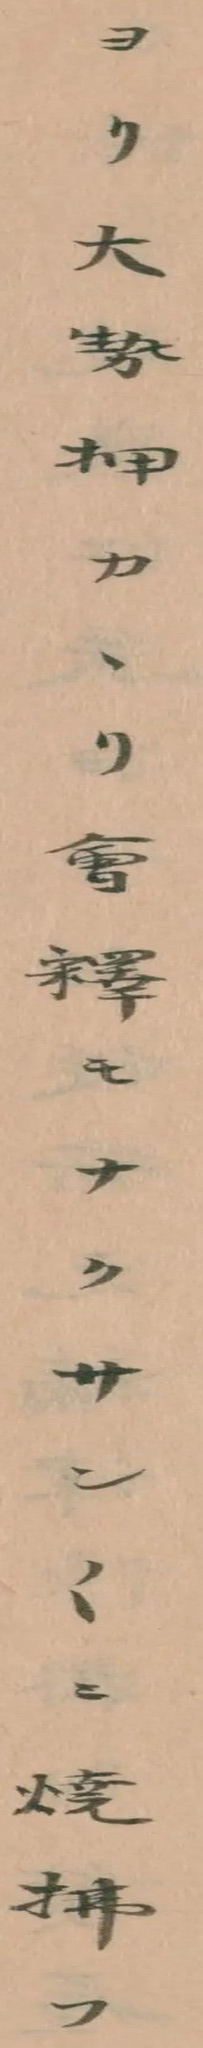ヨリ大勢押カゝり会釈モナクサン〳〵二焼払フ
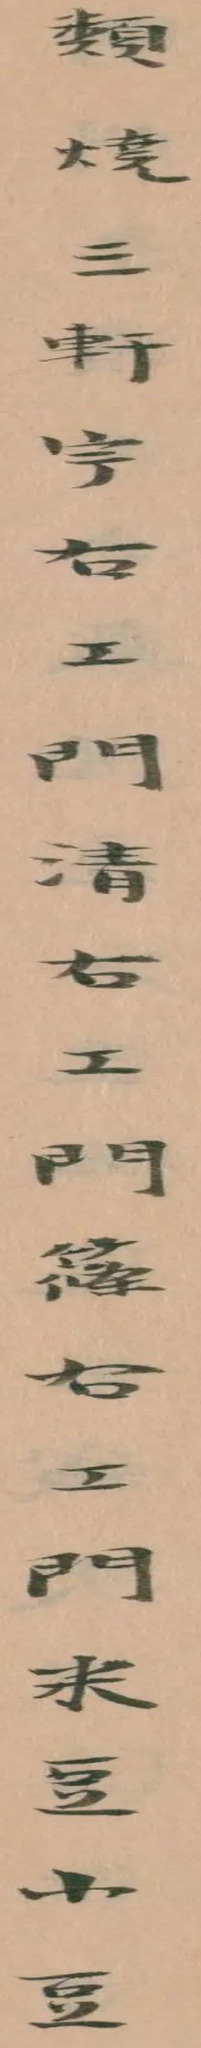類焼三軒宇右衛門清右衛門篠右衛門米豆小豆
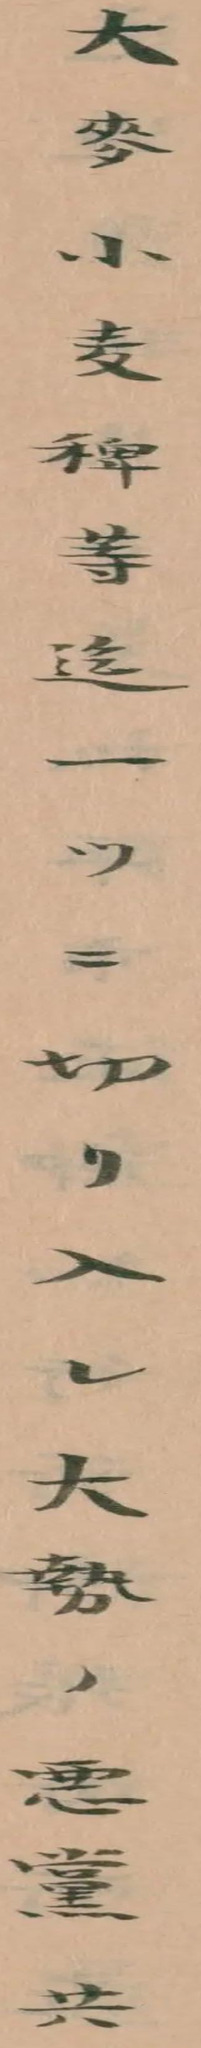大麦小麦稗等まで一ッ二切入レ大勢ノ悪党共
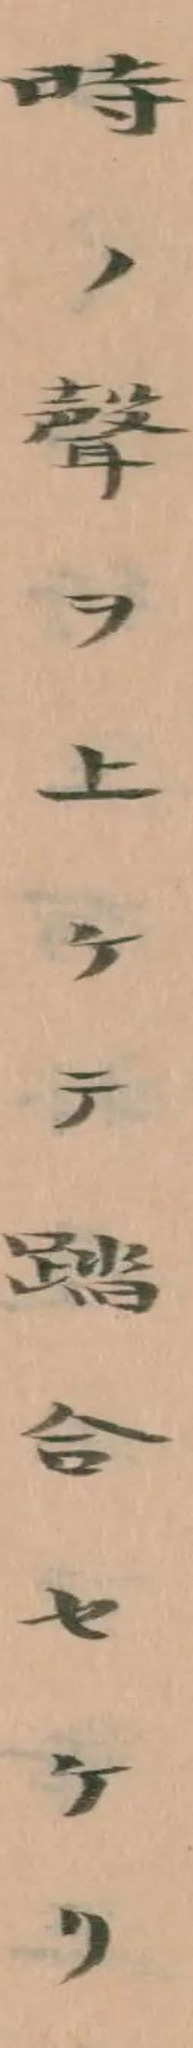時ノ声ヲ上ケテ踏合セケリ
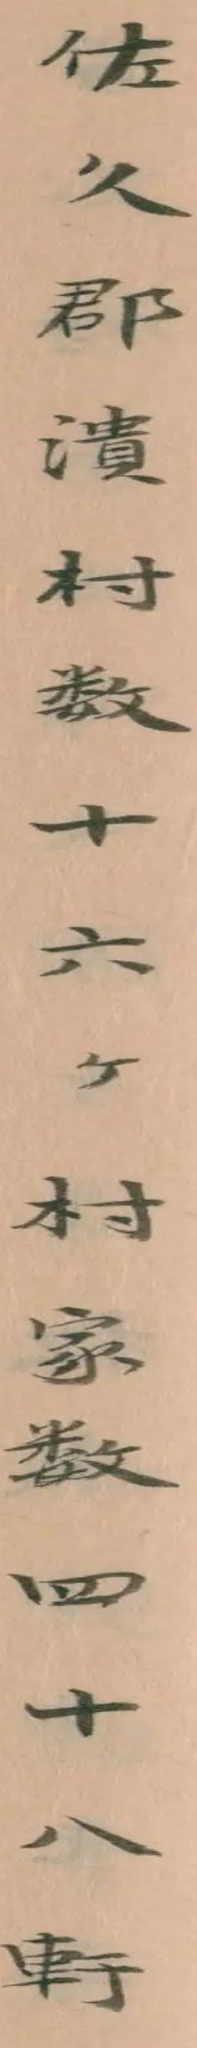佐久郡潰村数十六ヶ村価数四十八軒
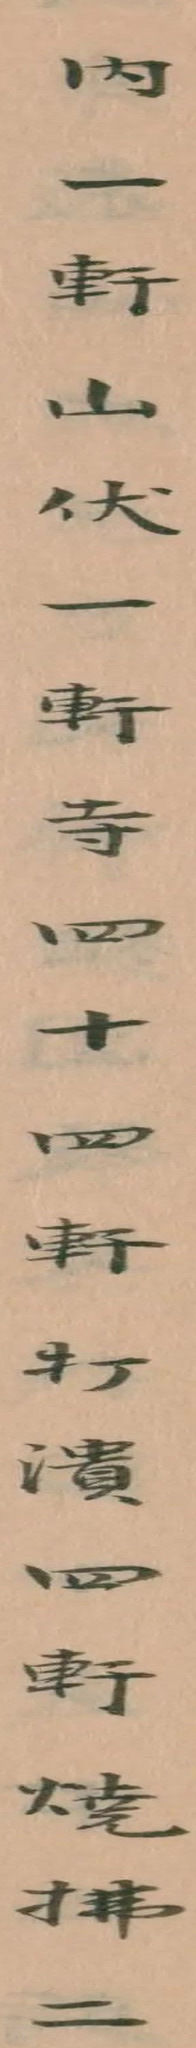内一軒山伏一軒寺四十四軒打潰四軒焼払二
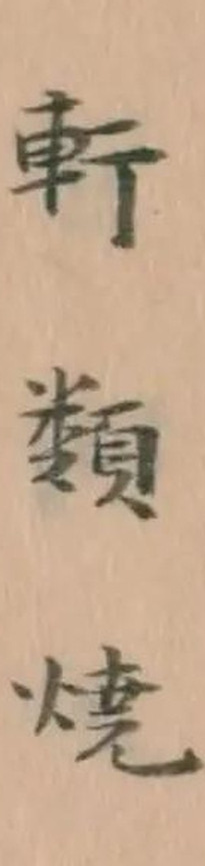軒類焼
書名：地災撮要. 巻3(地震之部)-巻4(噴火之部)
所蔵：国立国会図書館 National Diet Library, JAPAN
